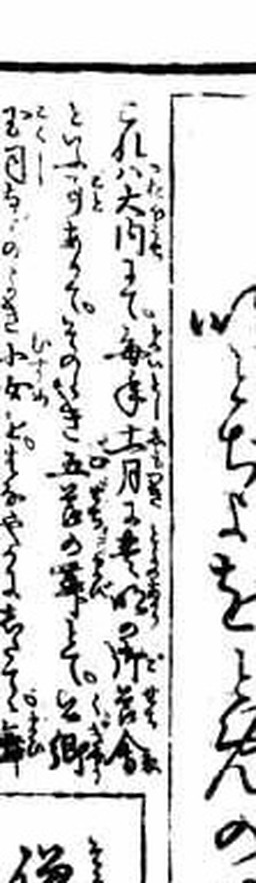これは大内にて毎年月に豊明の御節会
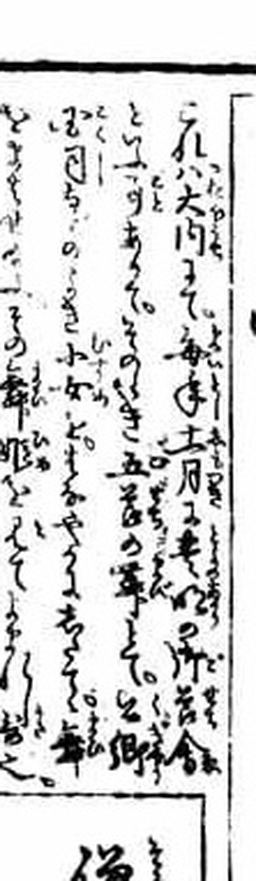といふ事ありてそのとき五節の童とて公卿僧
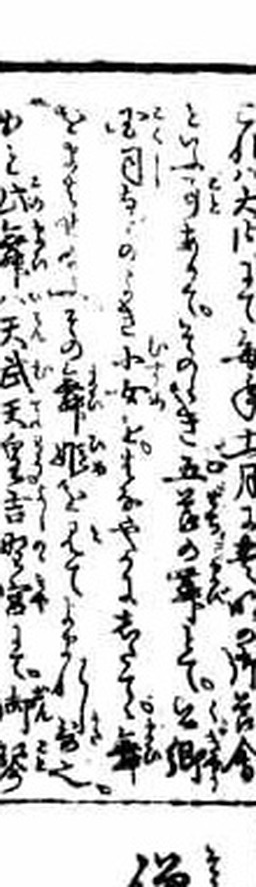国司などのとき小女をはなやかにしたてゝ舞正
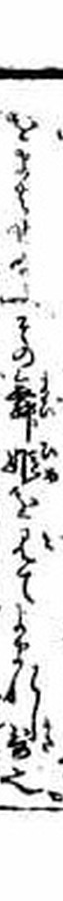をまはせ給ふそのその舞姫を見てよまれし哥也
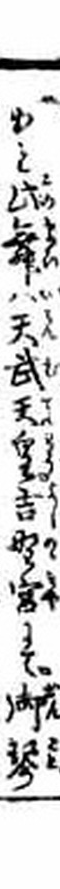もと此の舞は天武天皇野宮にて御琴
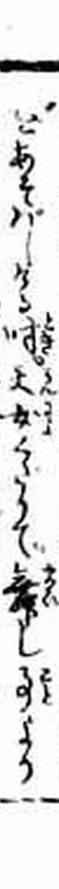をあそばしける時天女くだりて舞し事より
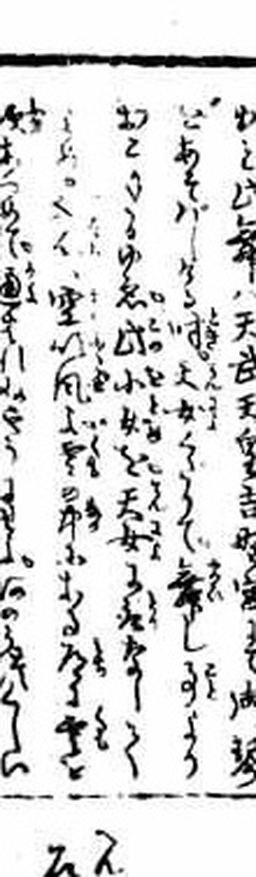おこるゆゑ此小女を天女に取なして
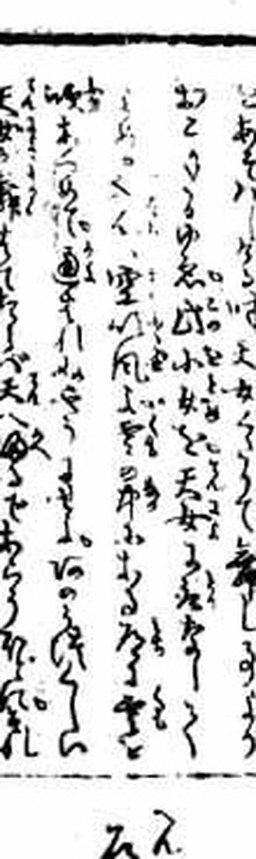よめる也心は空吹風よ雲の中にある道に雲を遍
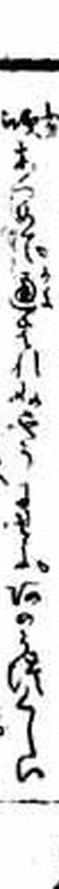吹あつめて其通はれぬやうによせてあのうつくしい照
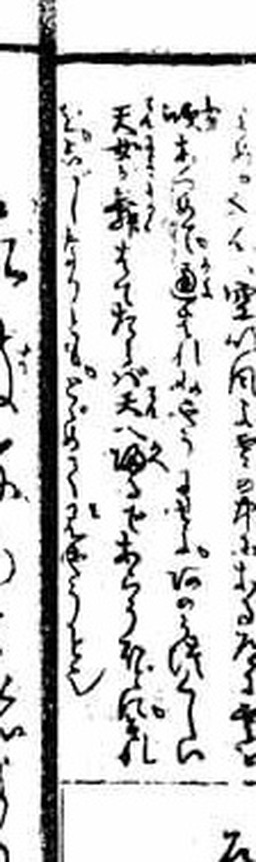天女か舞はてたらば天へ帰るであらうほどにそれ
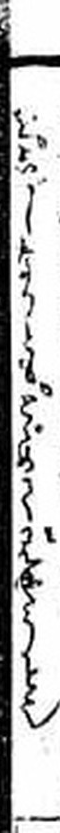をしばしなりともとゞめて見やうと也
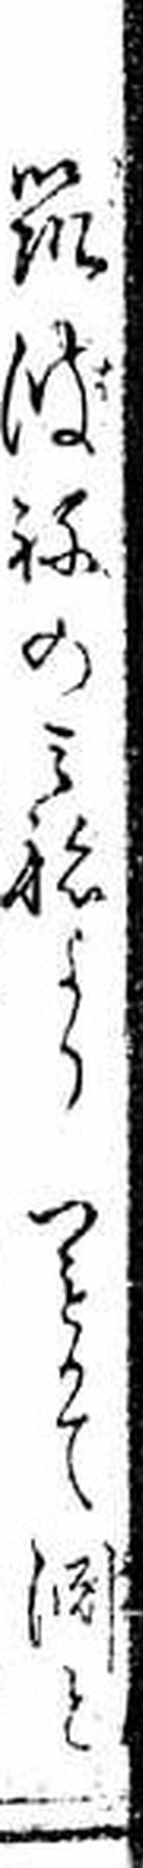筑波ねのみねよりつもりて淵と
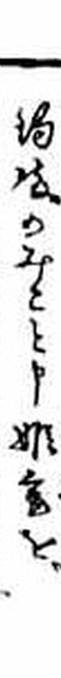釣殿のみこと申す姫宮を
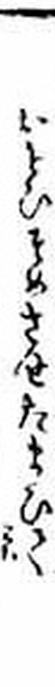おもひそめさせたまひて
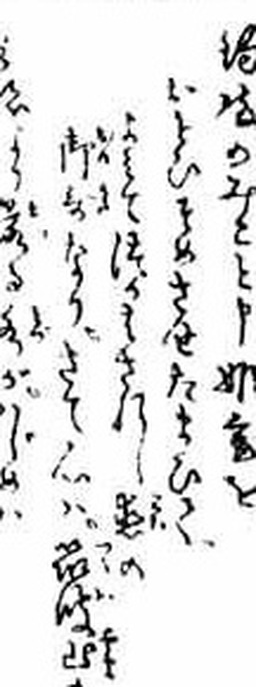よみてつかはされし恋の
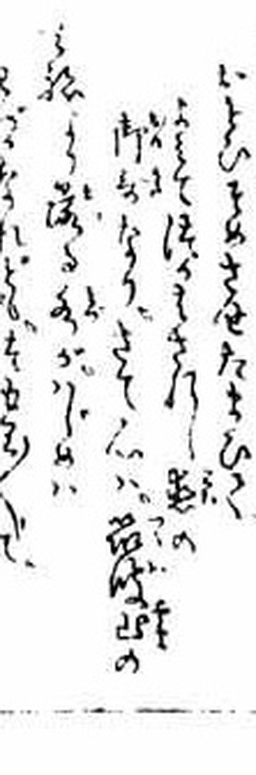御哥なりさて心は筑波山の
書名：小倉百人一首
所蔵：東京学芸大学教育コンテンツアーカイブ
